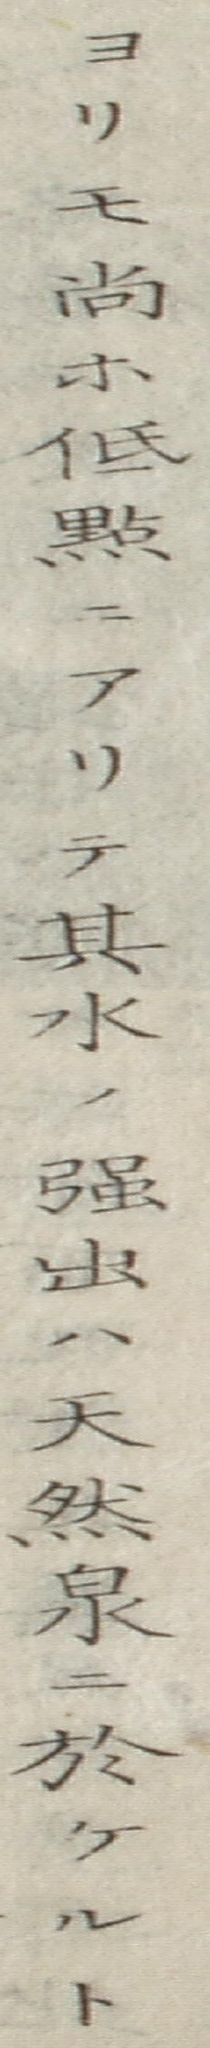ヨリモ尚ホ低点ニアリテ其水ノ強出ハ天然泉ニ於ケルト
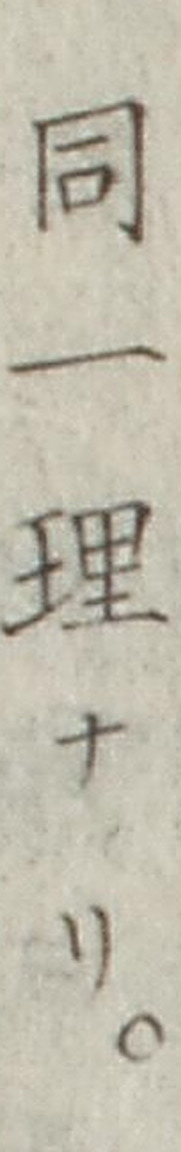同一理ナリ。
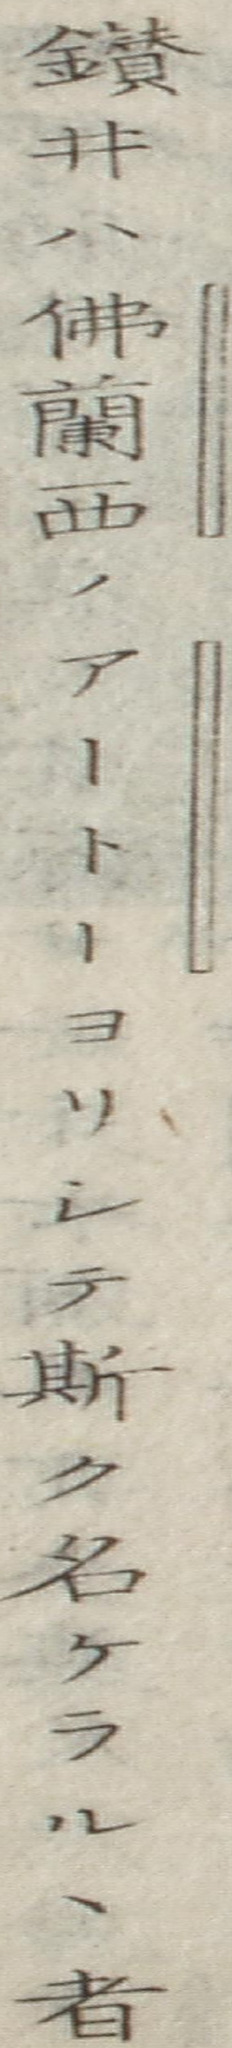鑚井ハ仏蘭西ノアートーヨリシテ斯ク名ケラルヽ者
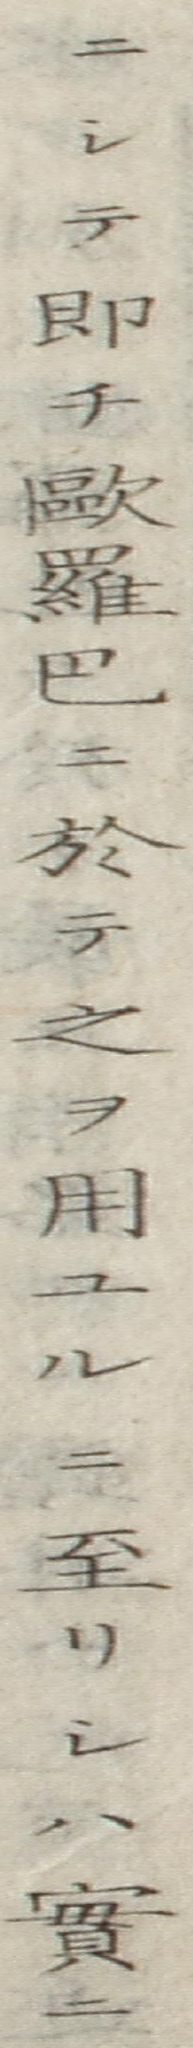ニシテ即チ欧羅巴ニ於テ之ヲ用ユルニ至リシハ實ニ
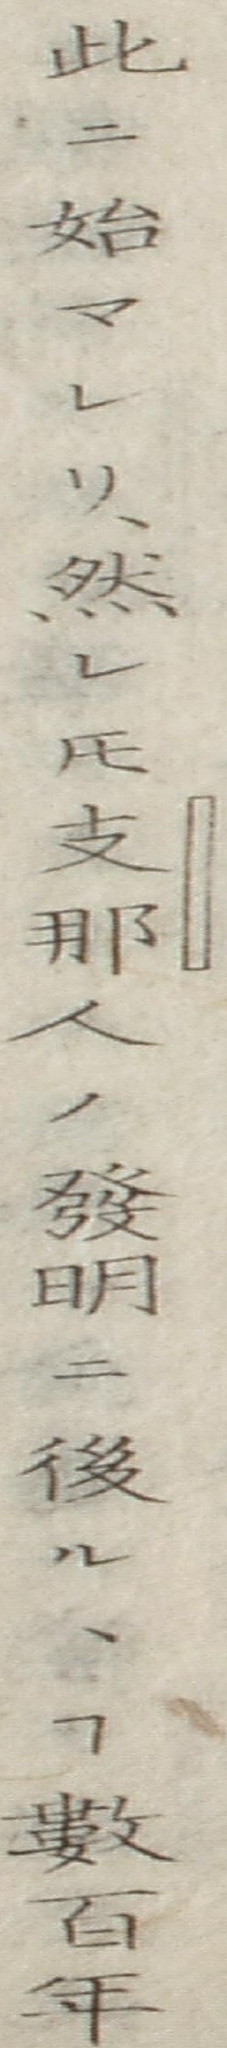此ニ始マレリ、然レ𪜈支那人ノ発明ニ後ルヽヿ数百年
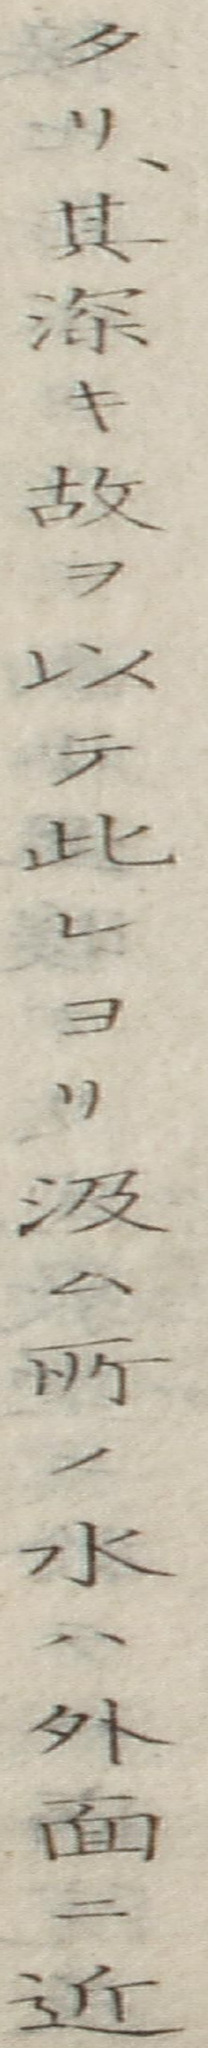タリ、其深キ故ヲ以テ此レヨリ汲ム所ノ水ハ外面ニ近

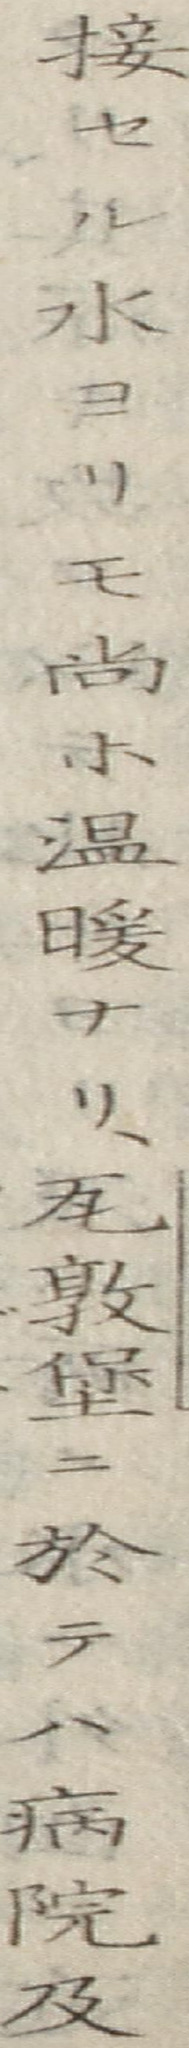接セル水ヨリモ尚ホ温暖ナリ、瓦敦堡ニ於テハ病院及
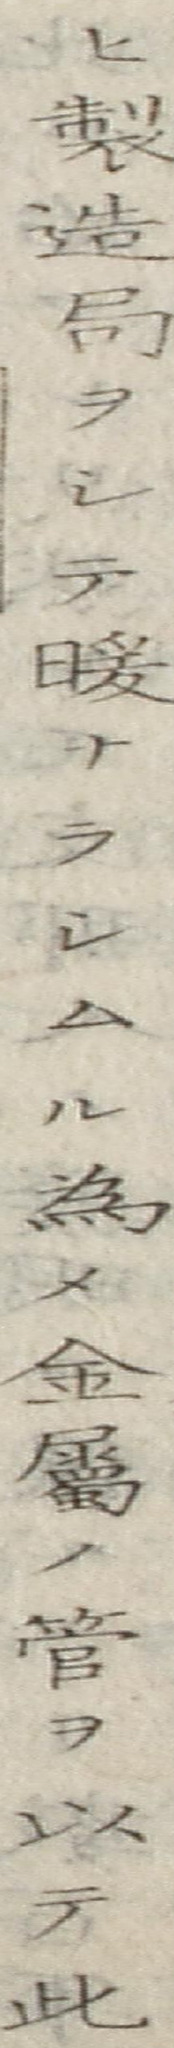ヒ製造局ヲシテ暖ナラシムル為メ金属ノ管ヲ以テ此
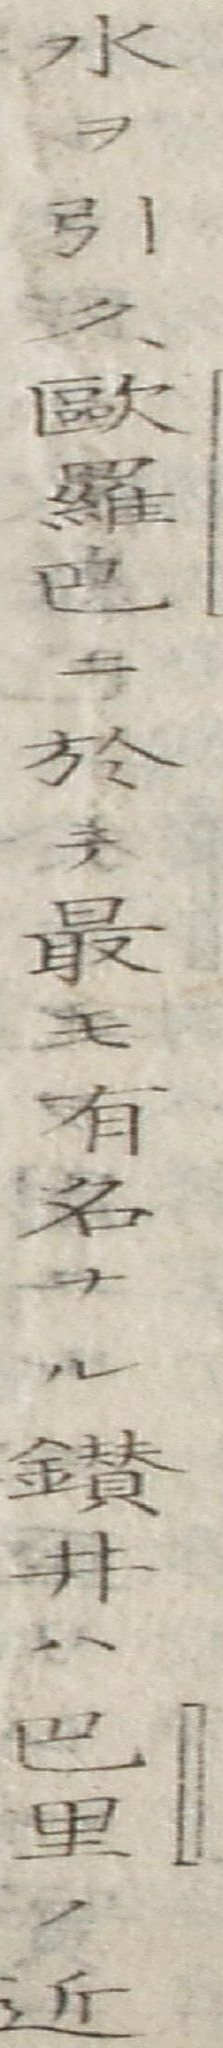水ヲ引ク、欧羅巴ニ於テ最モ有名ナル鑚井ハ巴里ノ近
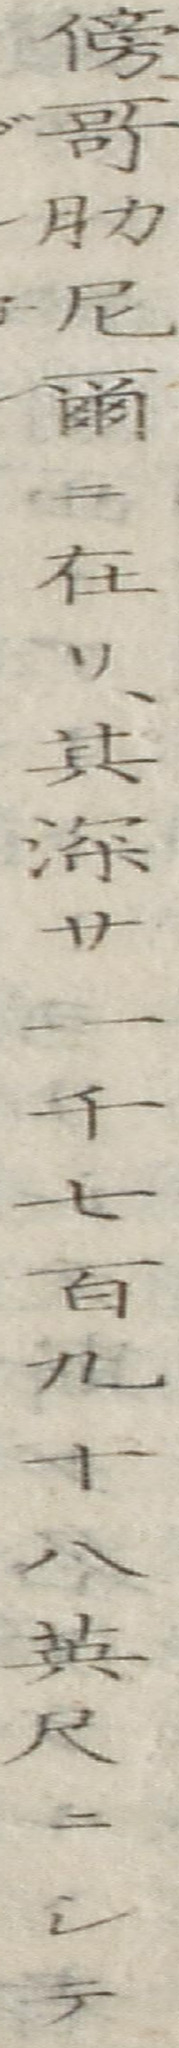傍哥肋尼爾ニ在リ、其深サ一千七百九十八英尺ニシテ
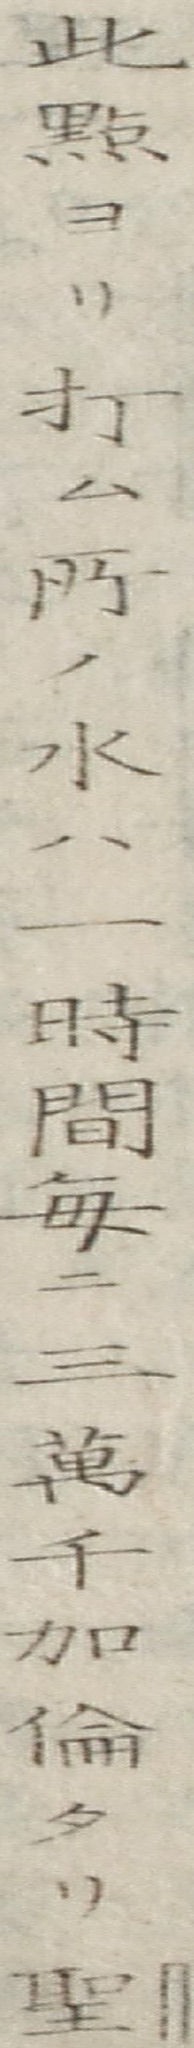此点ヨリ打ム所ノ水ハ一時間毎ニ三万加倫タリ聖
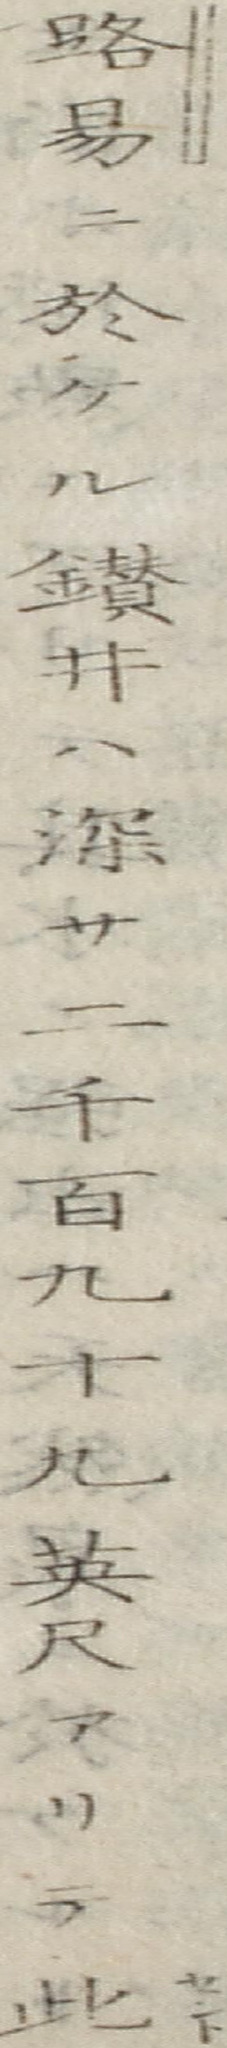路易ニ於ケル鑚井ハ深サ二千百九十九英尺アリテ此
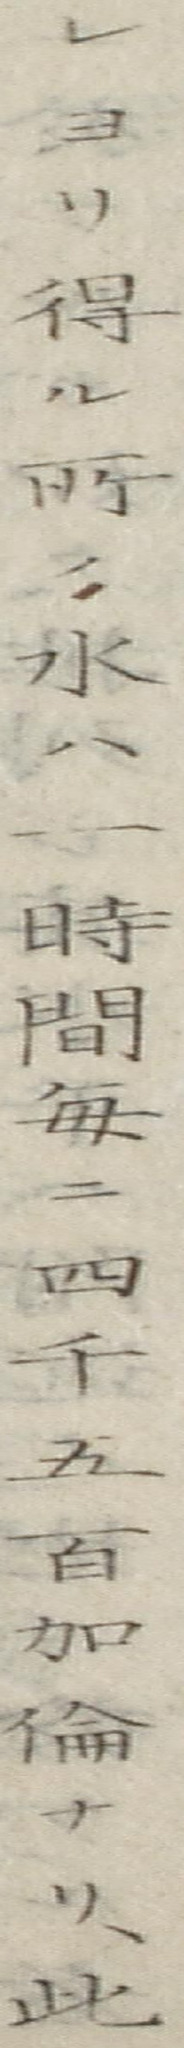レヨリ得所ノ水ハ一時間毎ニ四千五百加倫ナリ、此
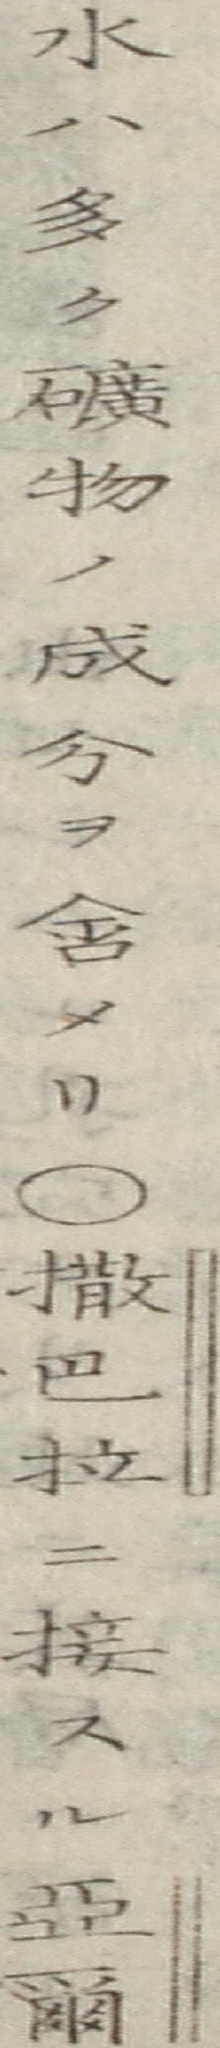水ハ多ク鉱物ノ成分ヲ含メリ○撒巴拉ニ接スル亜爾
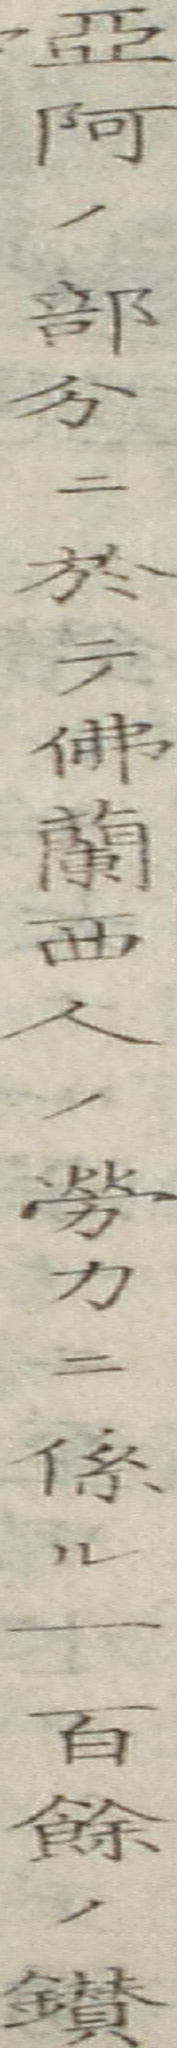亜阿ノ部分ニ於テ仏蘭西人ノ労力ニ係ル一百余ノ鑚
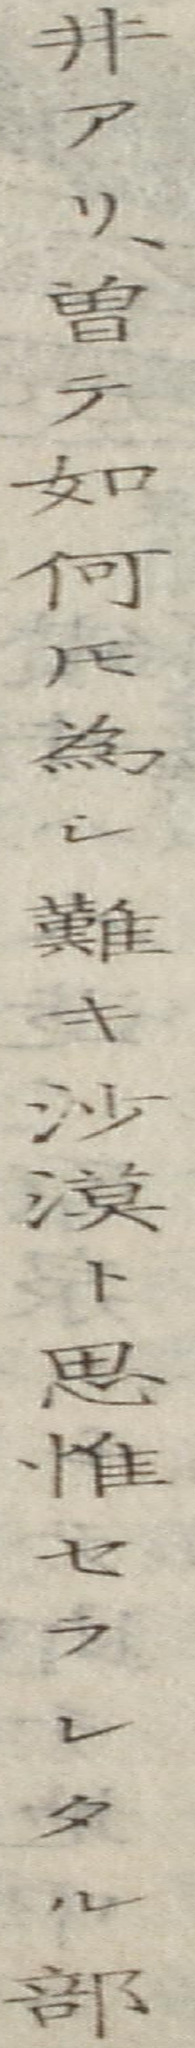井アリ、曽テ如何𪜈為シ難キ沙漠ト思惟セラレタル部
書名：地形論　巻二
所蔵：東京大学地震研究所図書室 Earthquake Research Institute Library, The University of Tokyo, JAPAN
